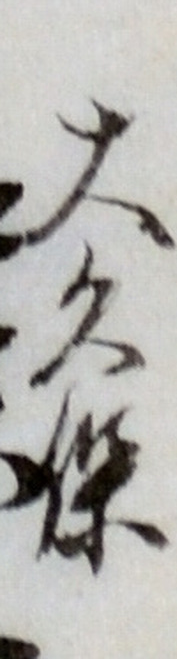大久保
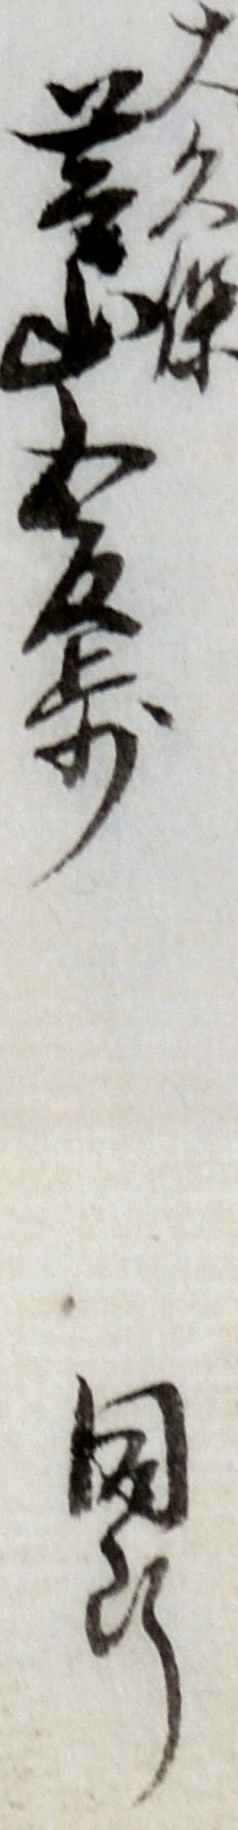芝山五反歩同断
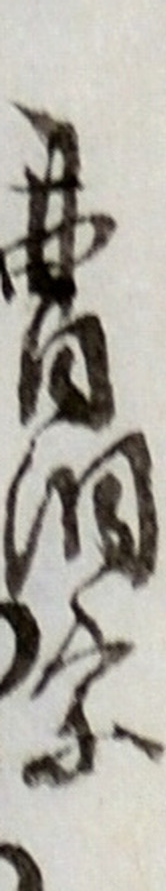曹洞宗
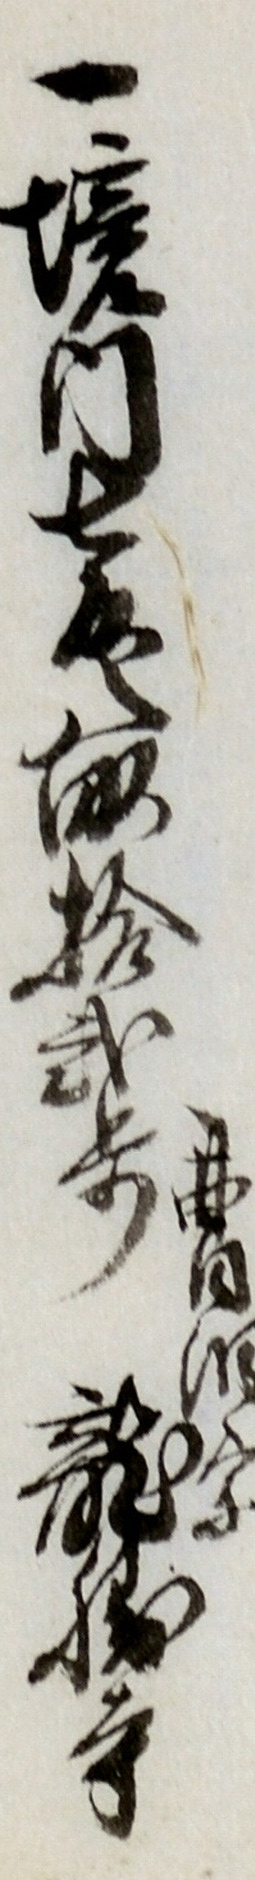一境内七反八畝拾弐歩龍勝寺
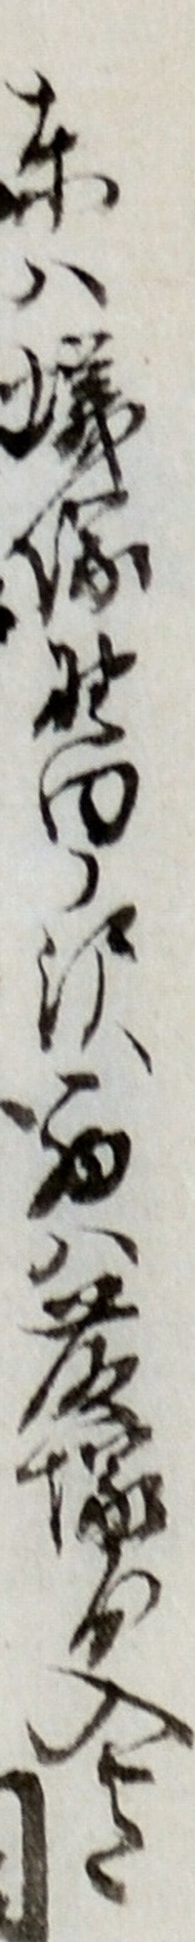東ハ蟻塚田ノ沢西ハ藤塚ゟ入会
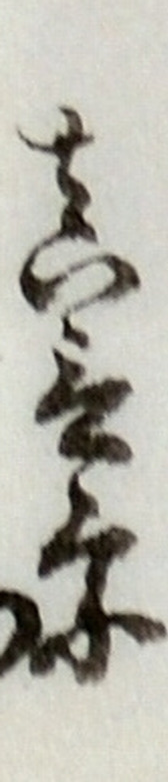真言宗
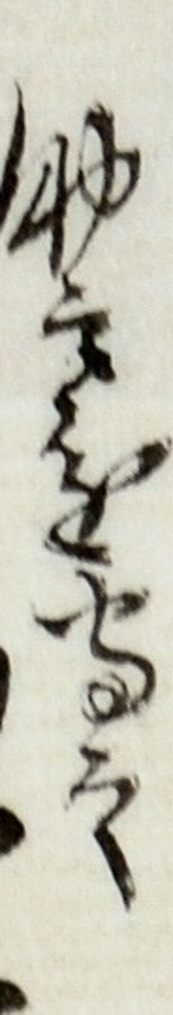助之進守之
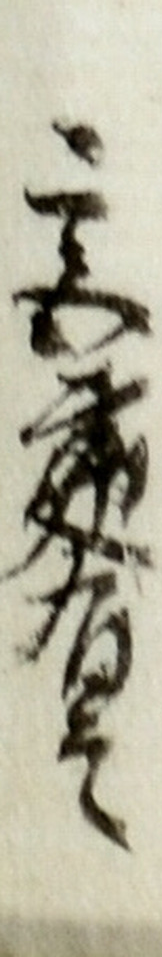宮建有之
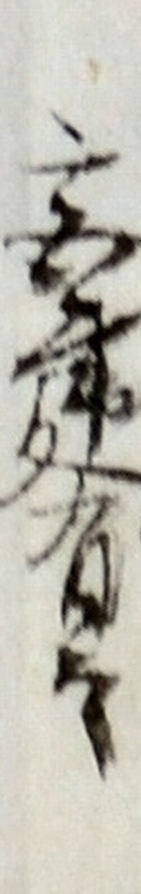宮建有之
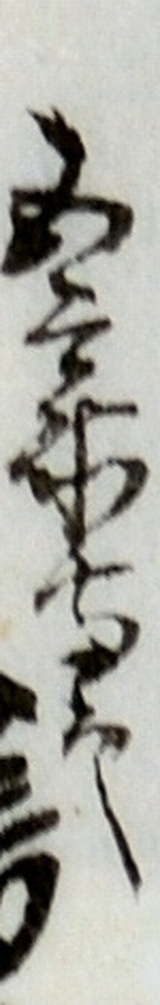五兵衛守之
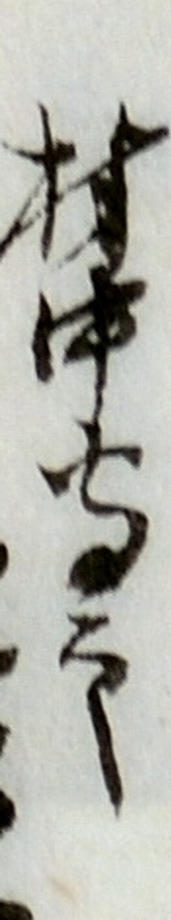村中守之
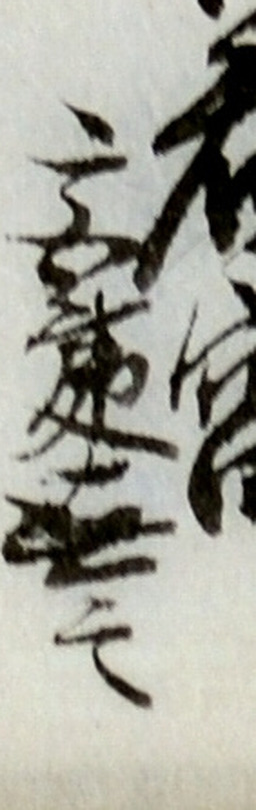宮建無之
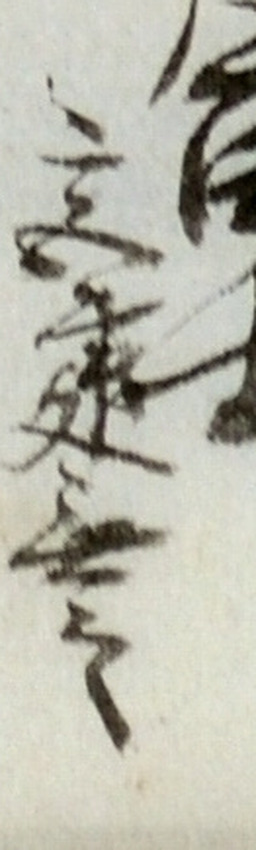宮建無之
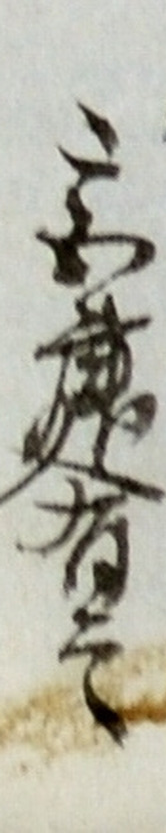宮建有之
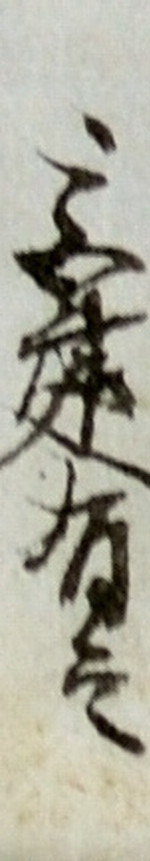宮建有之
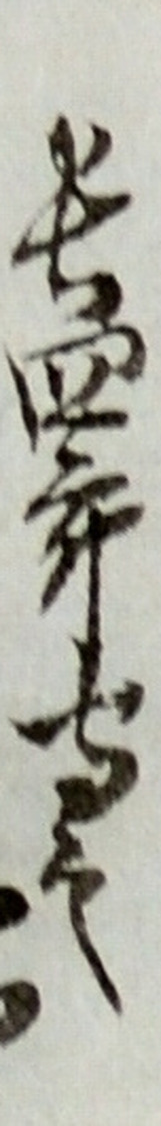長四郎守之
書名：御領分中山林社地手控
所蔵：伊那市立高遠町図書館・合同会社AMANE
